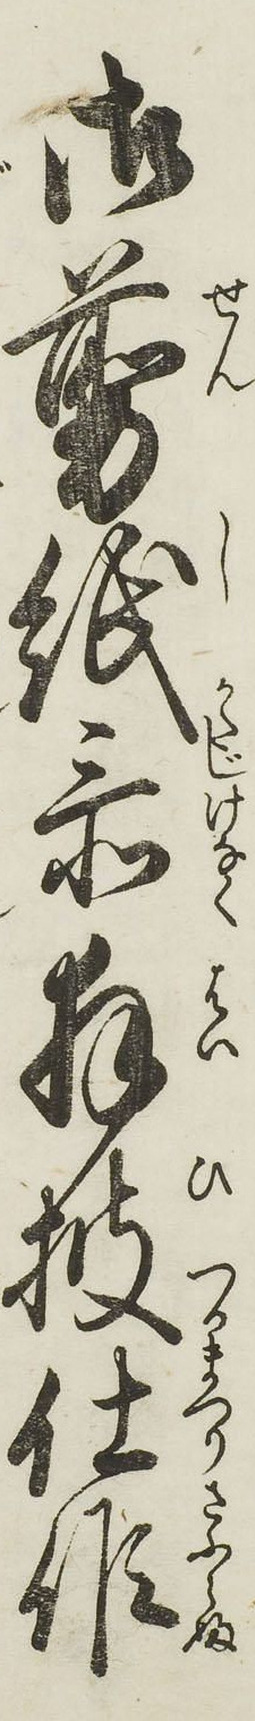御剪紙忝拝披仕候
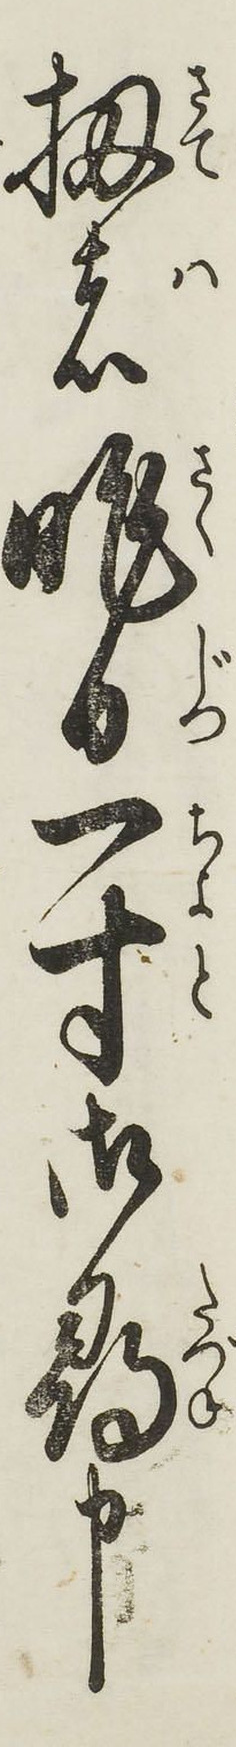扨者昨日一寸御尋申
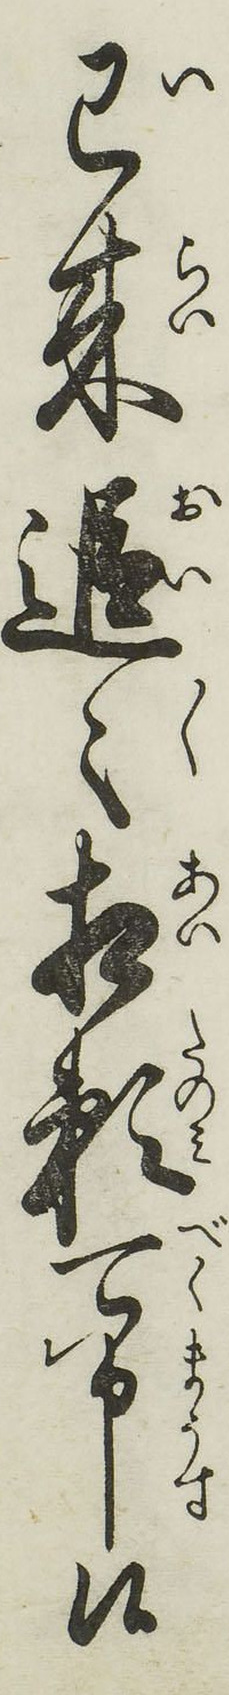已来追々相頼可申候

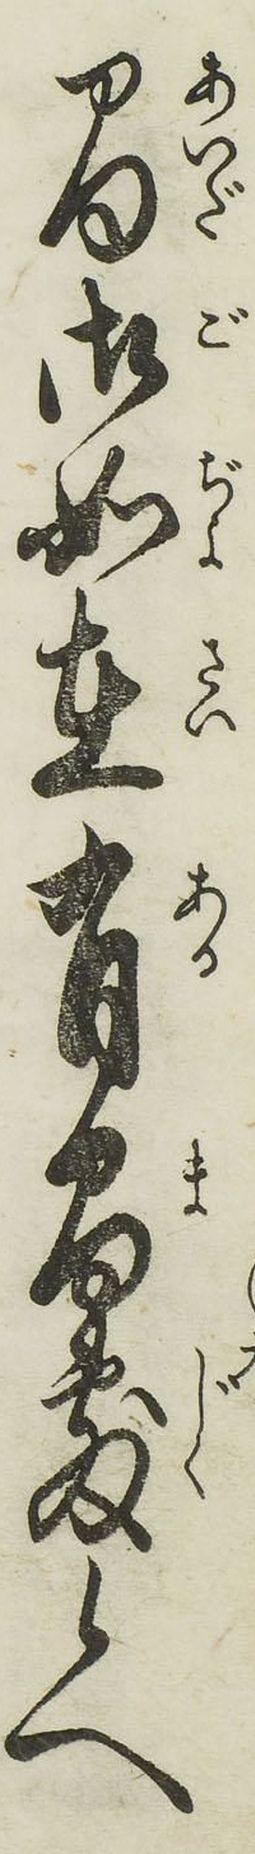間御如在有間敷候へ
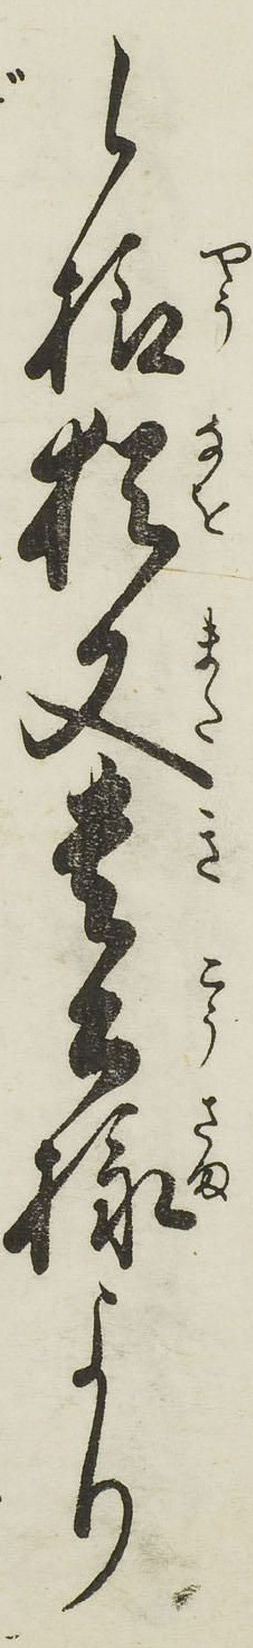候様猶又貴公様より
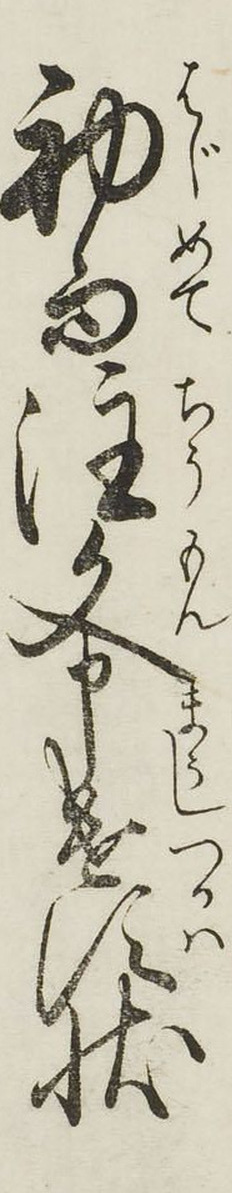初而注文申遣す状

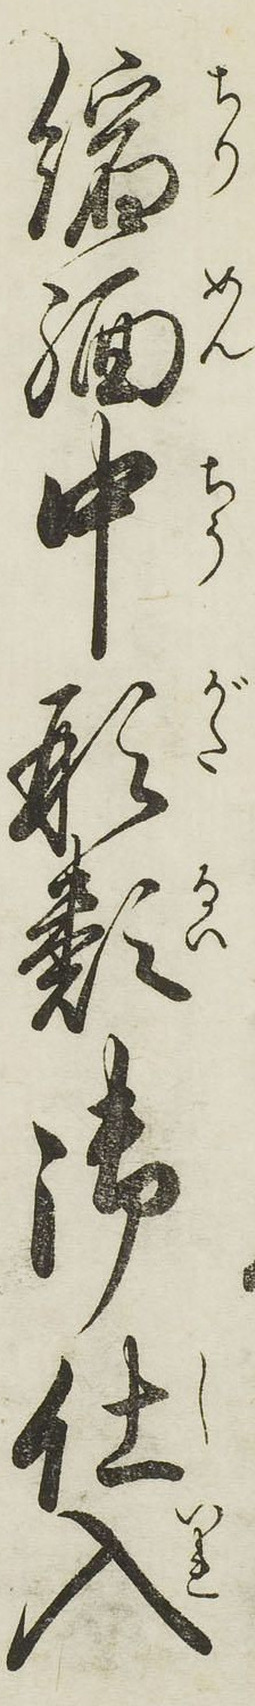縮緬中形類御仕入
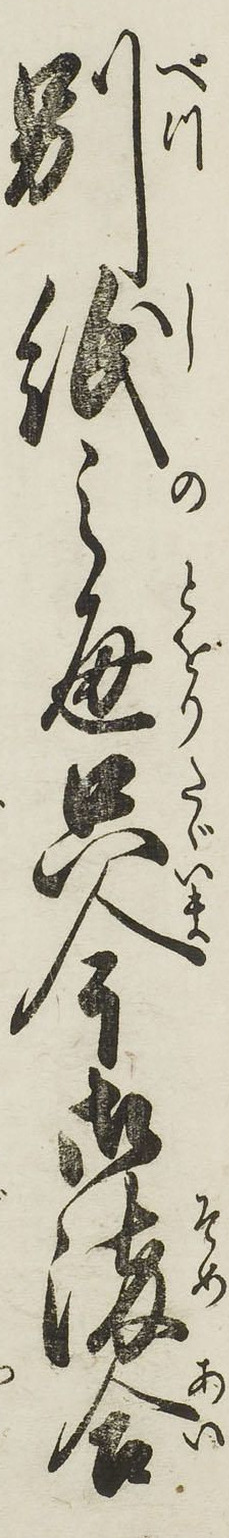別紙之通只今御染合

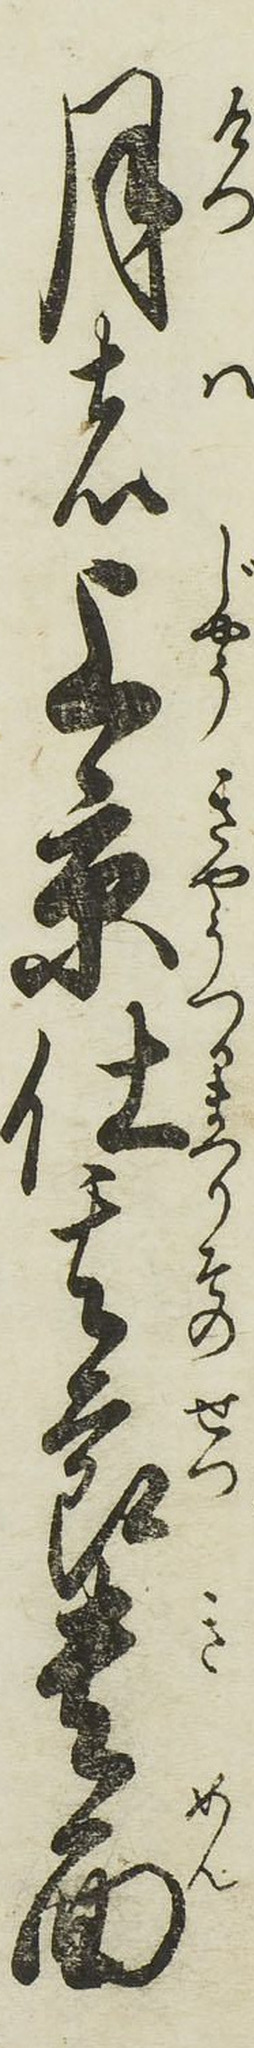月者上京仕其節貴面
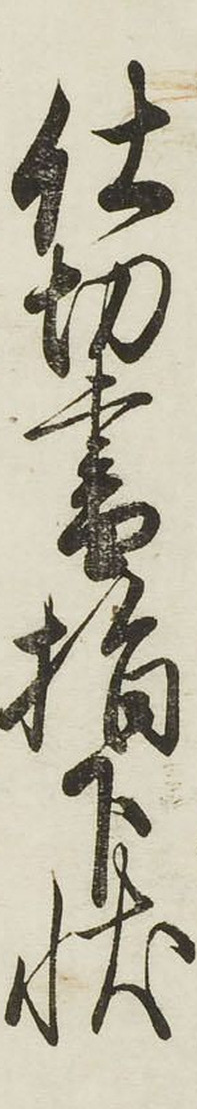仕切書指下状
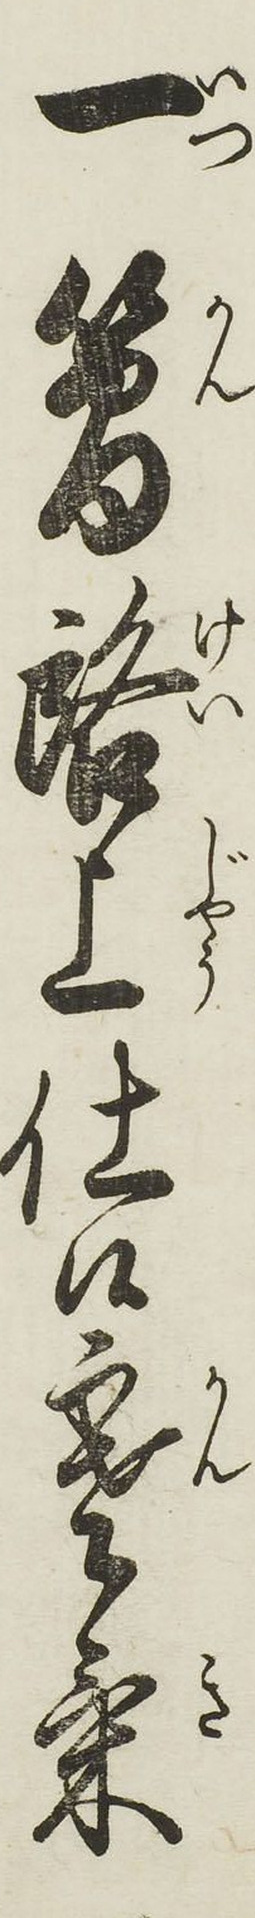一簡啓上仕候寒気
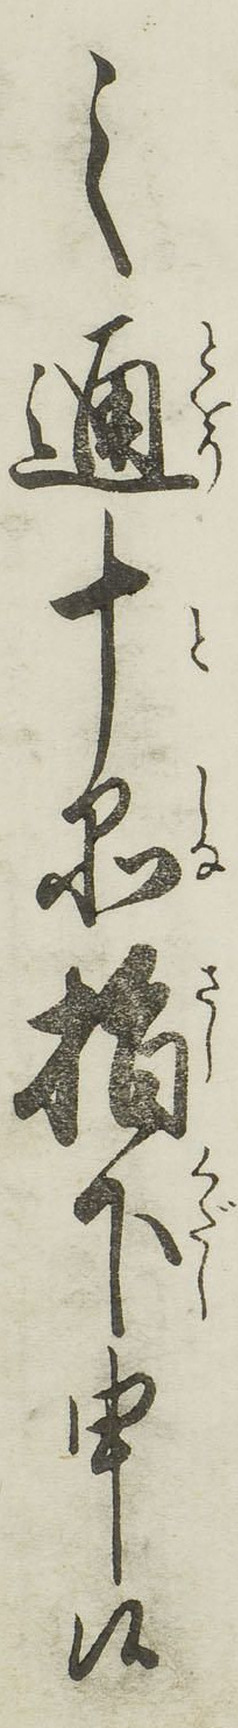之通十品指下申候

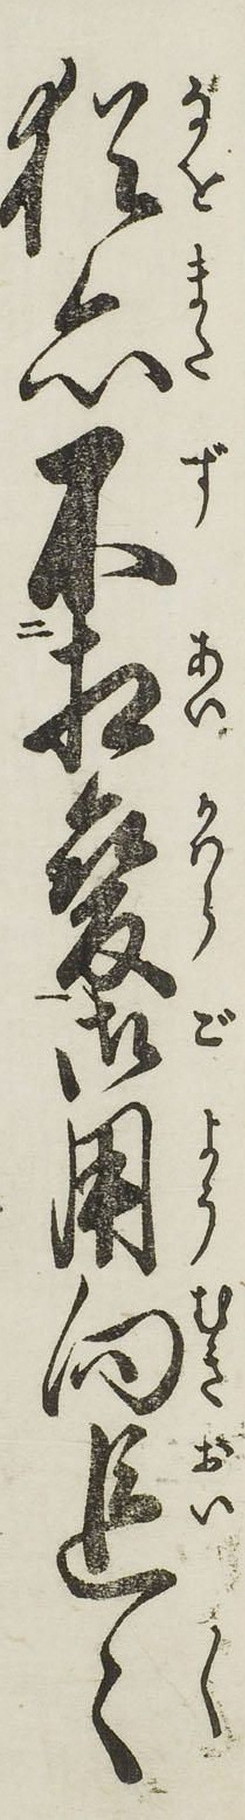猶亦不相変御用向追々
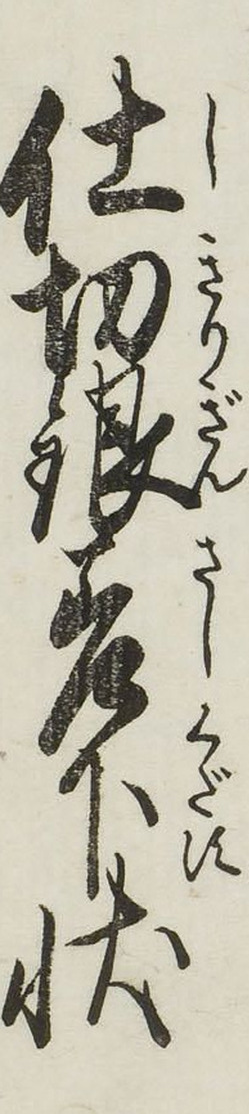仕切銀差下状

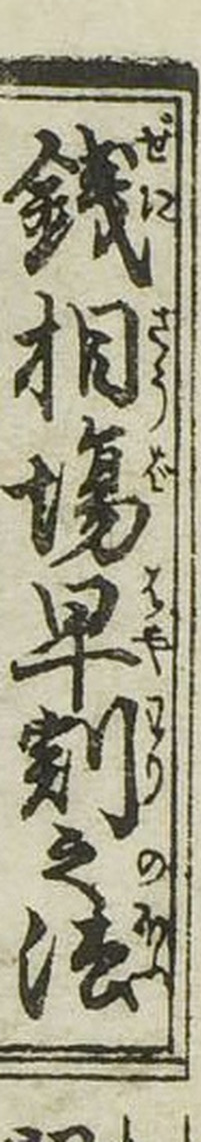銭相場早割之法
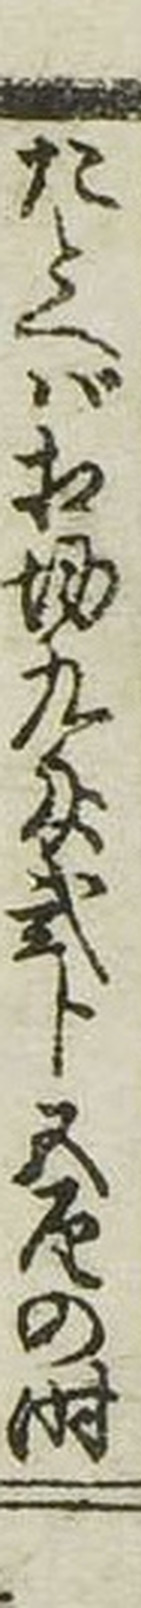たとへば相場九匁弐分五厘の時
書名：商人書翰便覧
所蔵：東京学芸大学教育コンテンツアーカイブ
